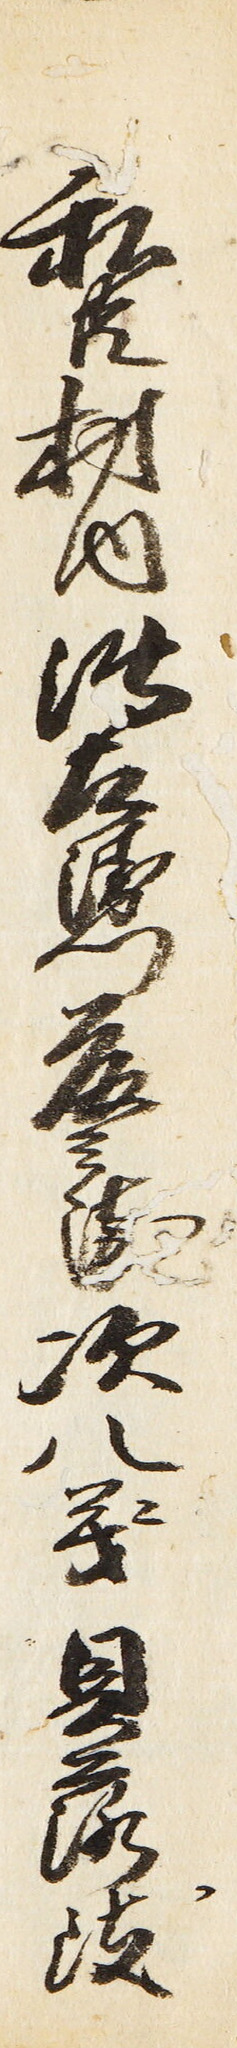一私共村内伝左衛門藤兵衛次八義貝落致
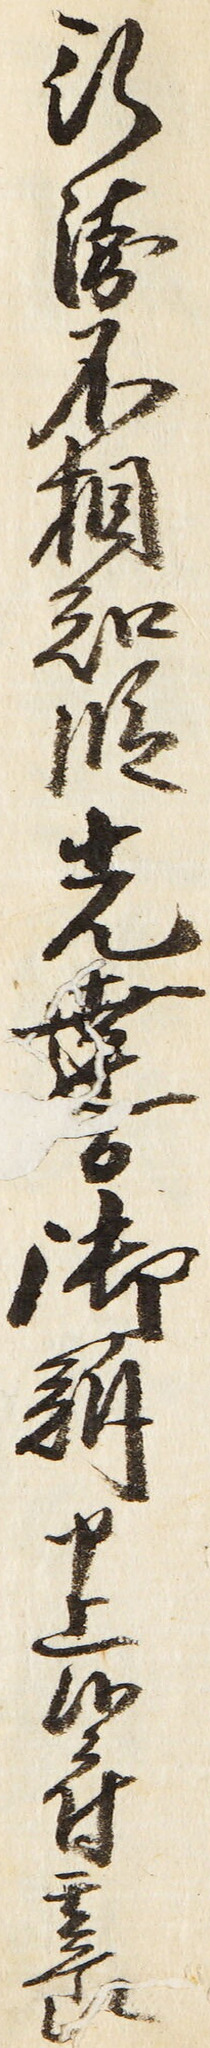行衛不相知段先達而御訴申上候ニ付其節
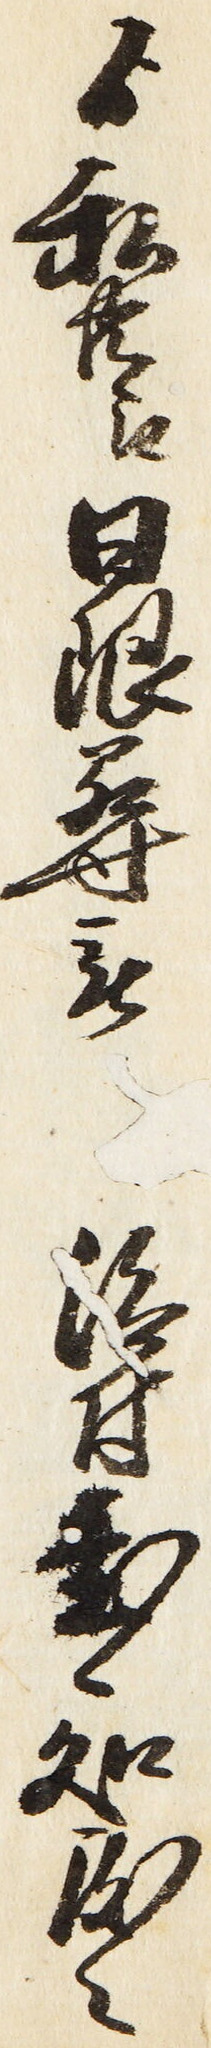ゟ私共江日限尋被仰付置候処度々
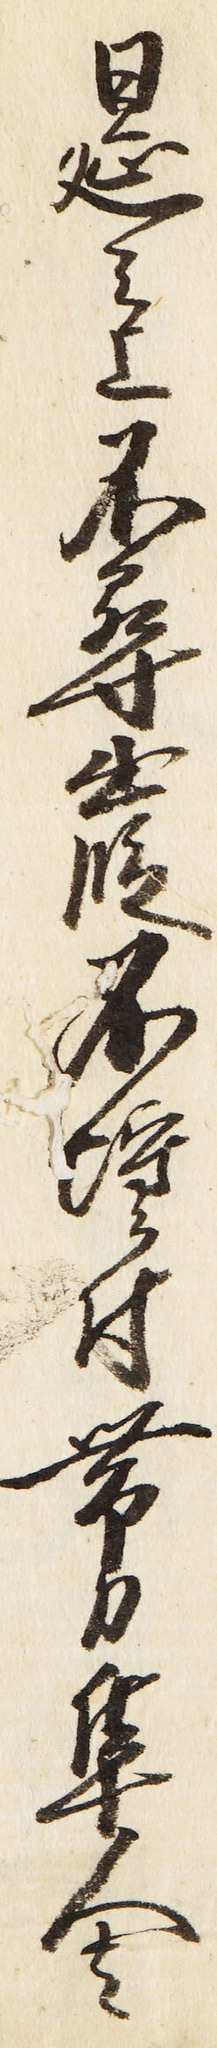日延之上不尋出段不埒ニ付帯刀隼人者
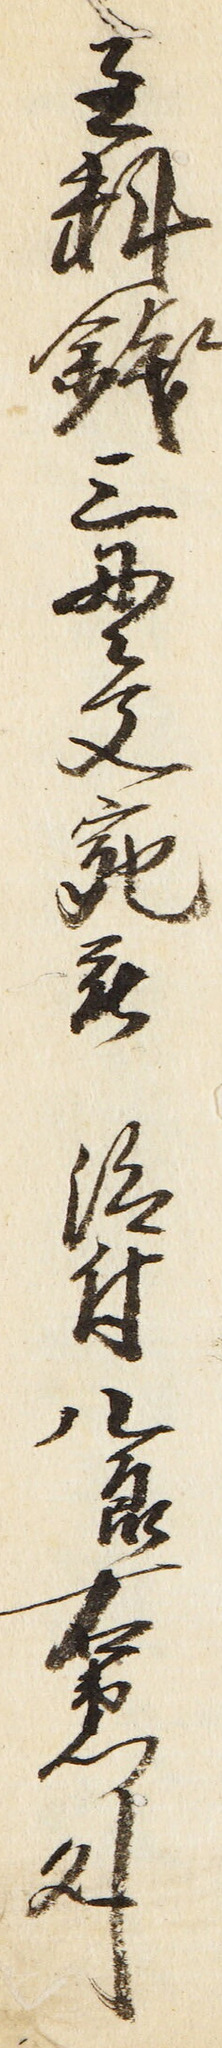過料銭三貫文宛被仰付八郎右衛門外

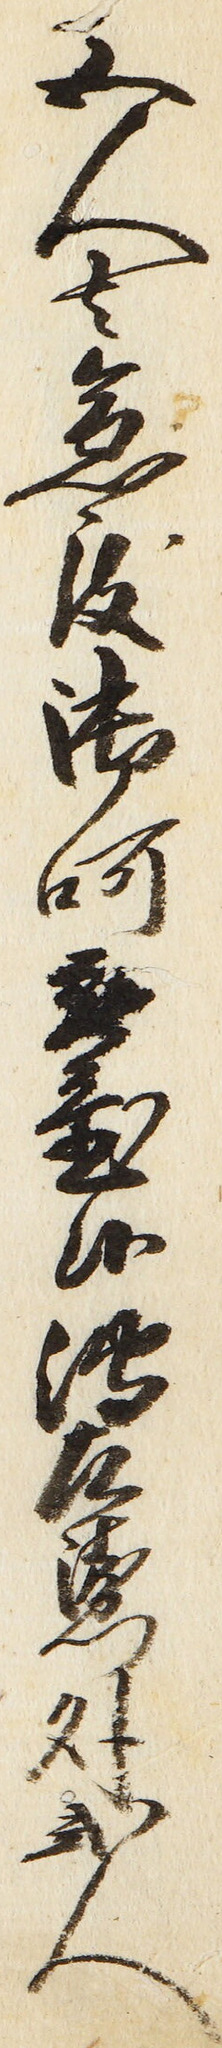五人者急度御呵被置候伝左衛門外弐人
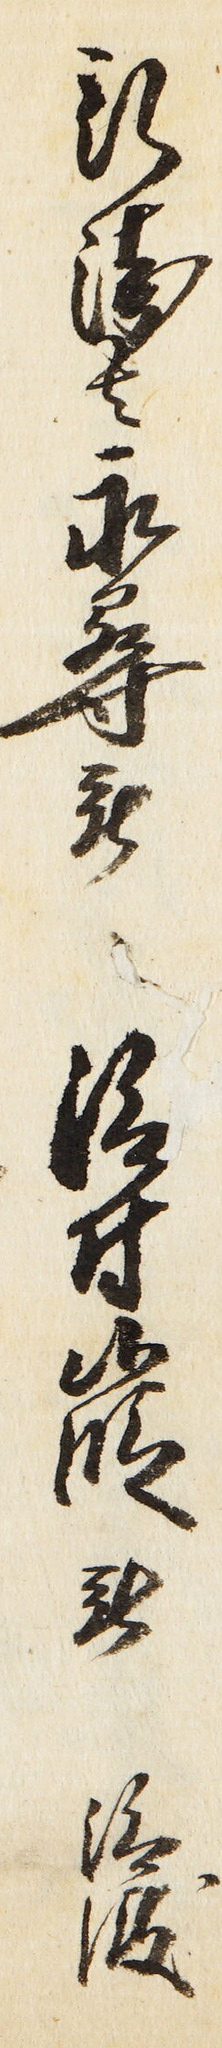行衛者永尋被仰付候段被仰渡
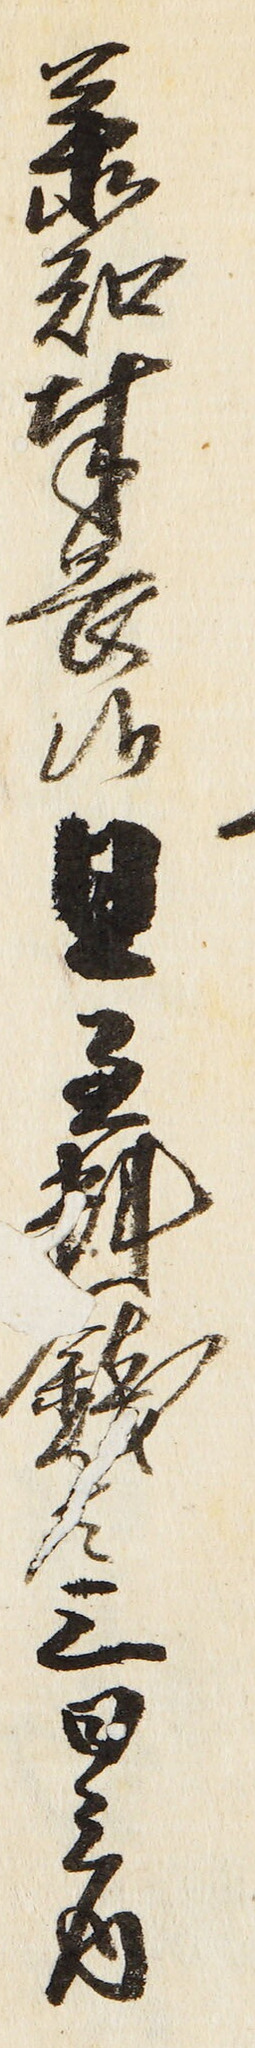承知奉畏候且過料銭共三日之内
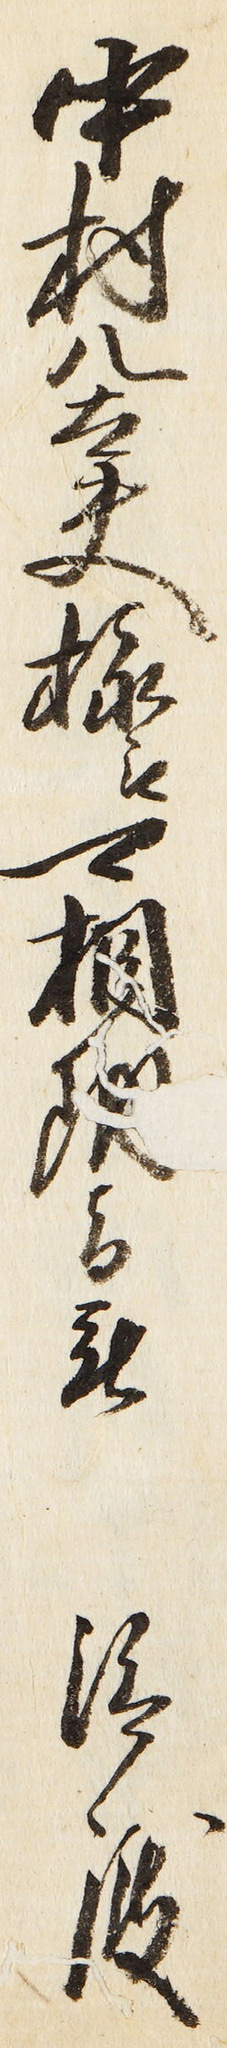中村八太夫様江可相旨被仰渡
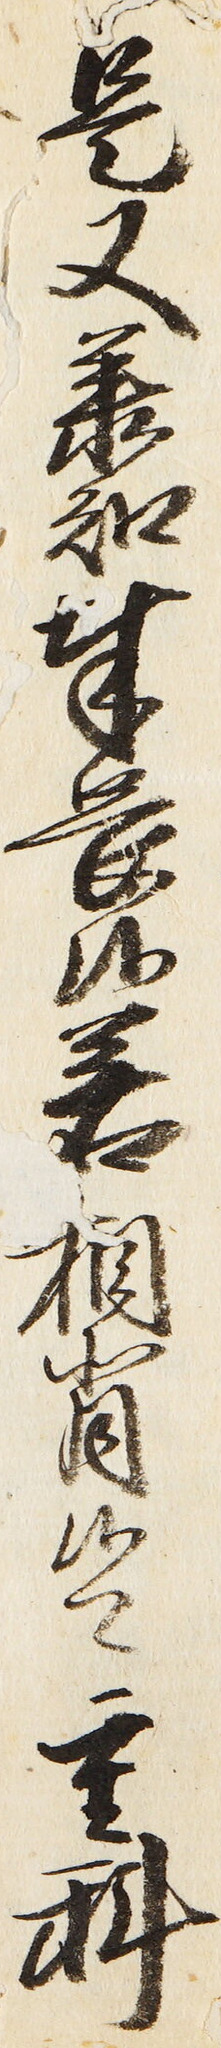是又承知奉畏候若相背候ハヽ重科
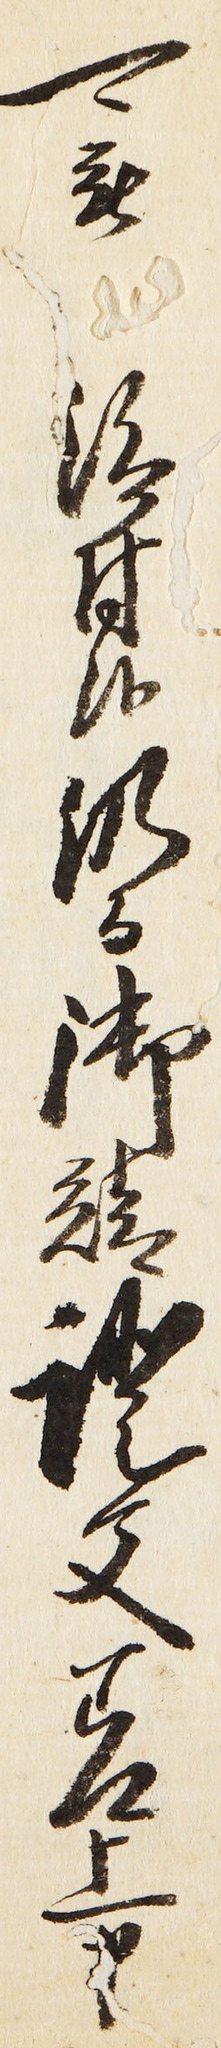可被仰付候依而御請証文差上申之
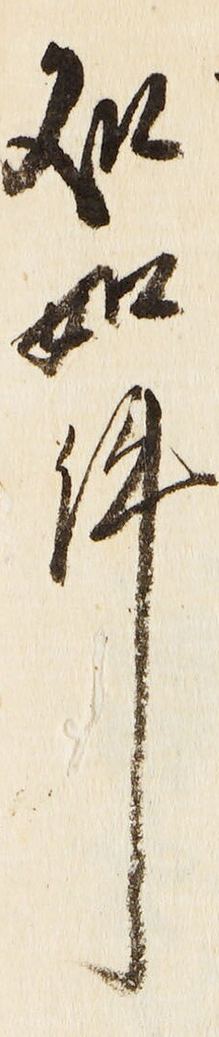処如件
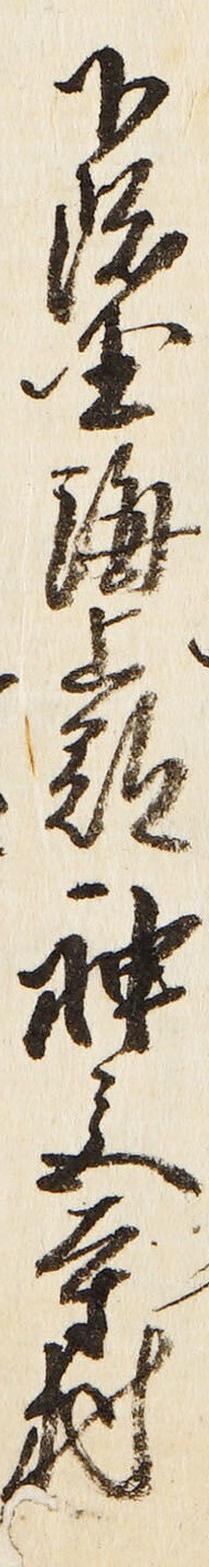下総国海上郡神宮寺村
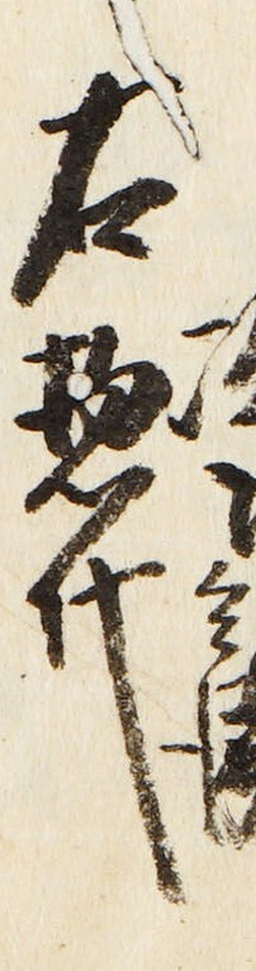右惣代
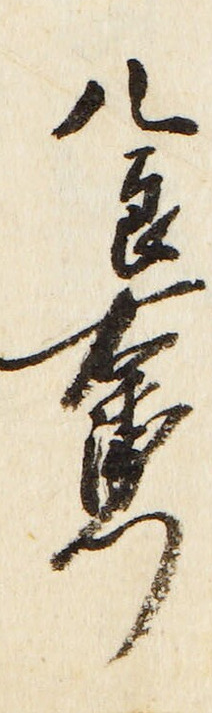八郎右衛門

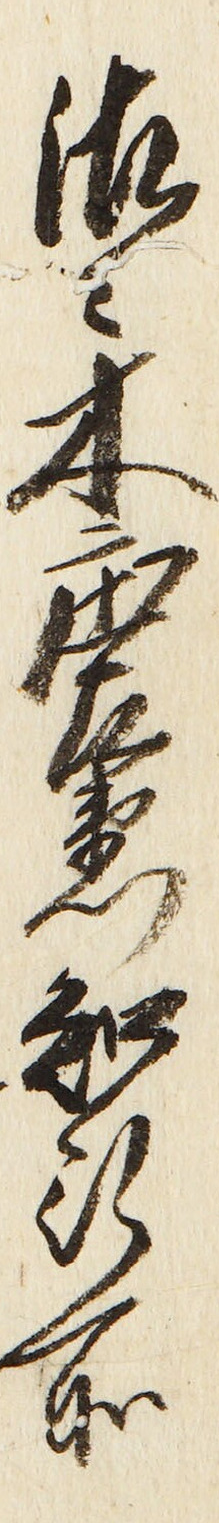佐々木庄左衛門知行所
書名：難船一件記録
